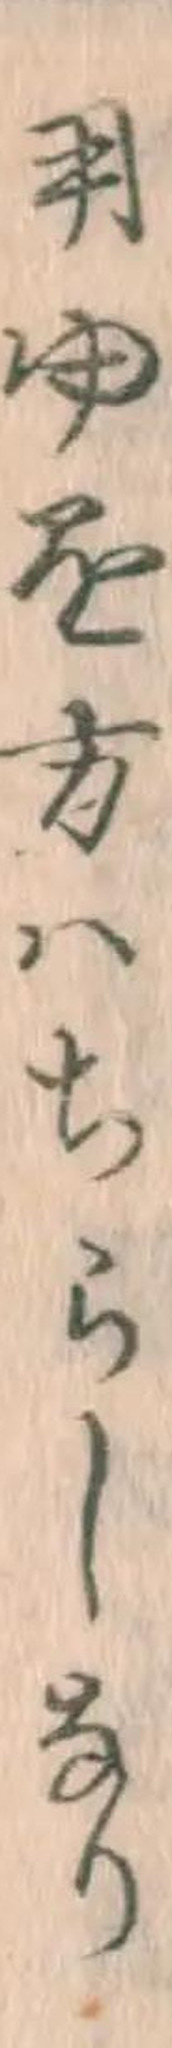用ゆ懸方はちらしなり
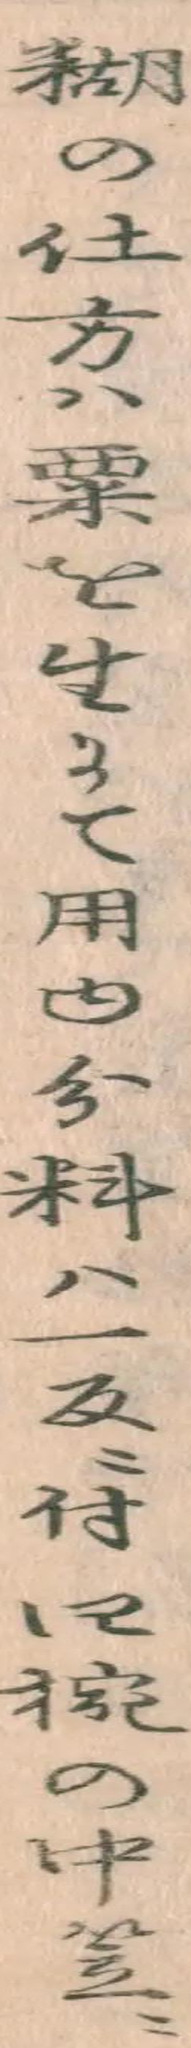一糊の仕方は粟を生にて用ゆ分料は一反に付四椀の中笠に
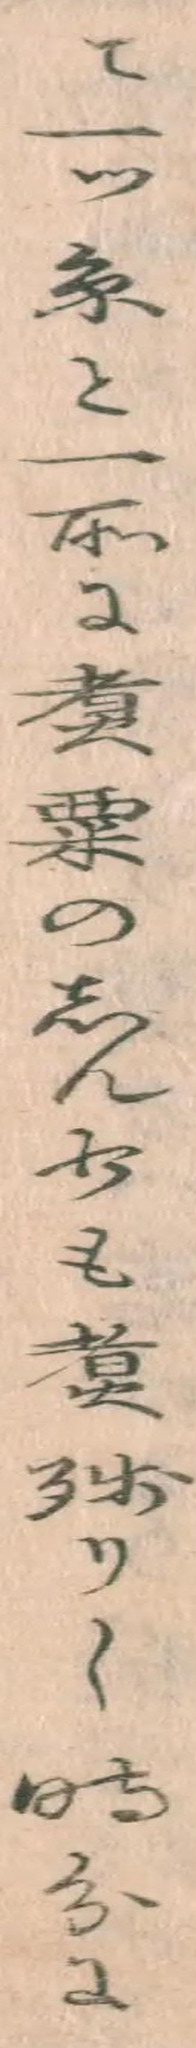て一ッ糸と一所に煮粟のしん少も煮残りし時分に
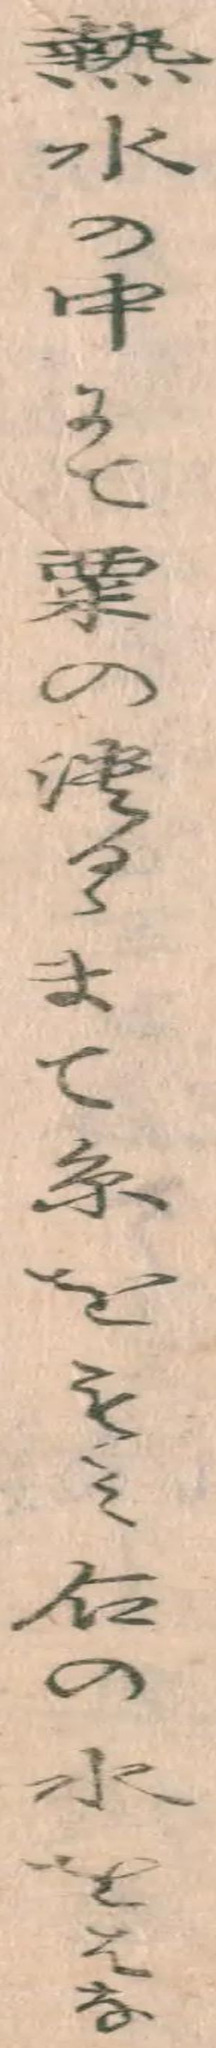熱水の中にて粟の潰るゝまて糸をもみ右の水をはな
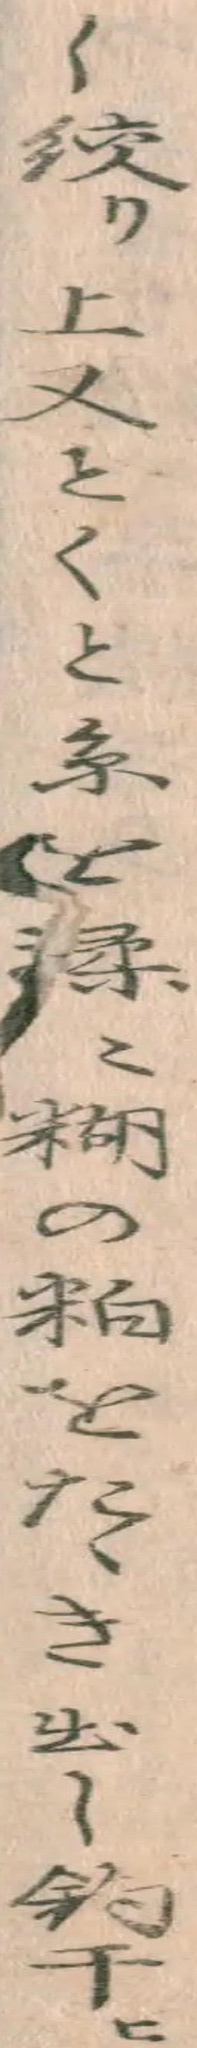し絞り上又とくと糸を揉に糊の粕をたゝき出し釣干に
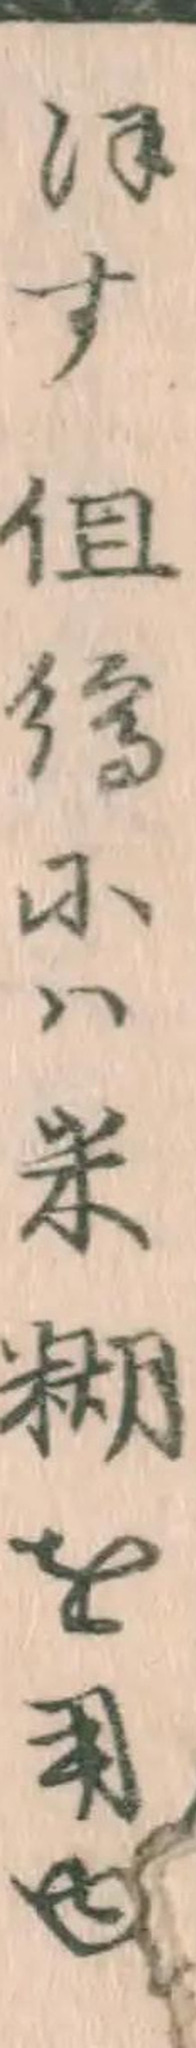ほす但縞には米糊を用ゆ
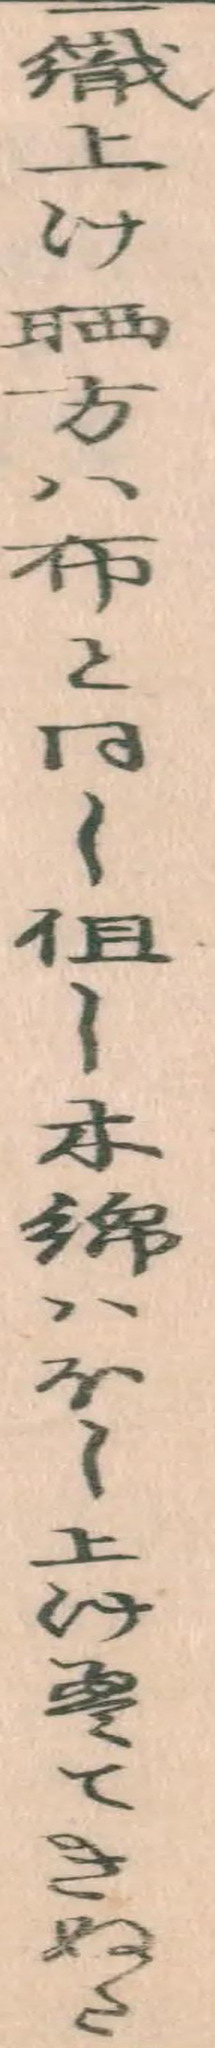一織上け晒方は布と同し但し木綿はほし上け畳てきぬた
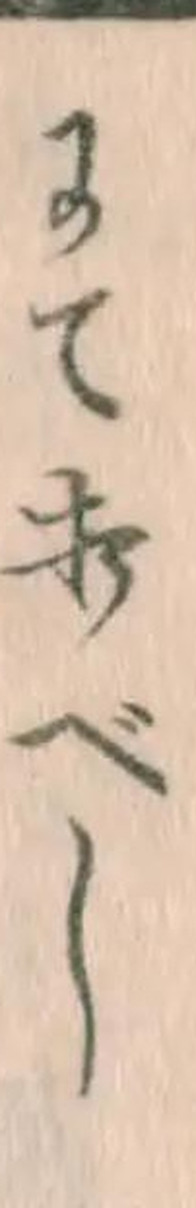にて打べし
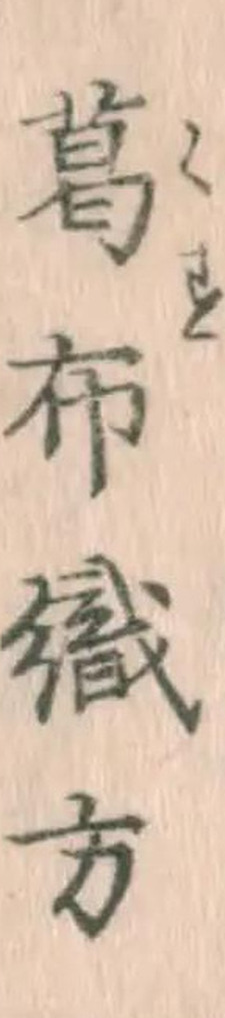葛布織方
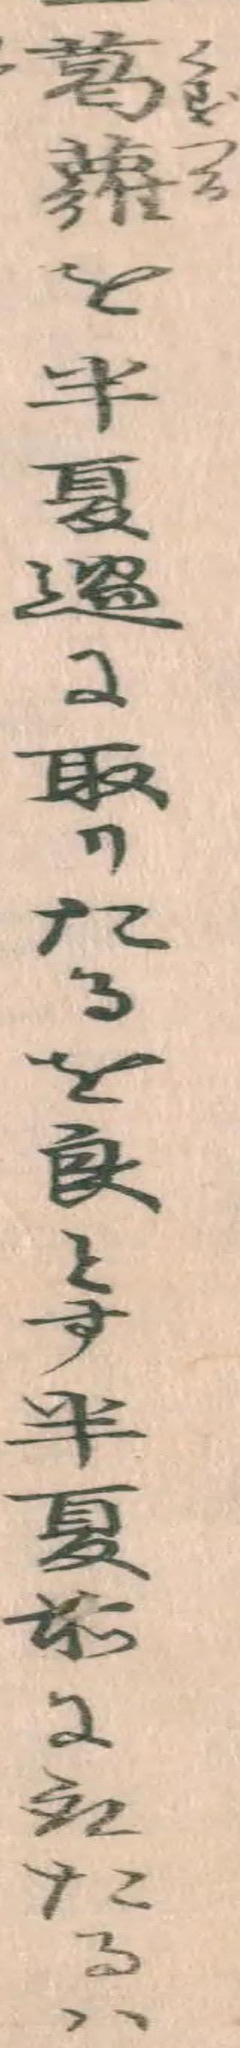一葛蘿を半夏過に取りたるを良とす半夏前に取たるは
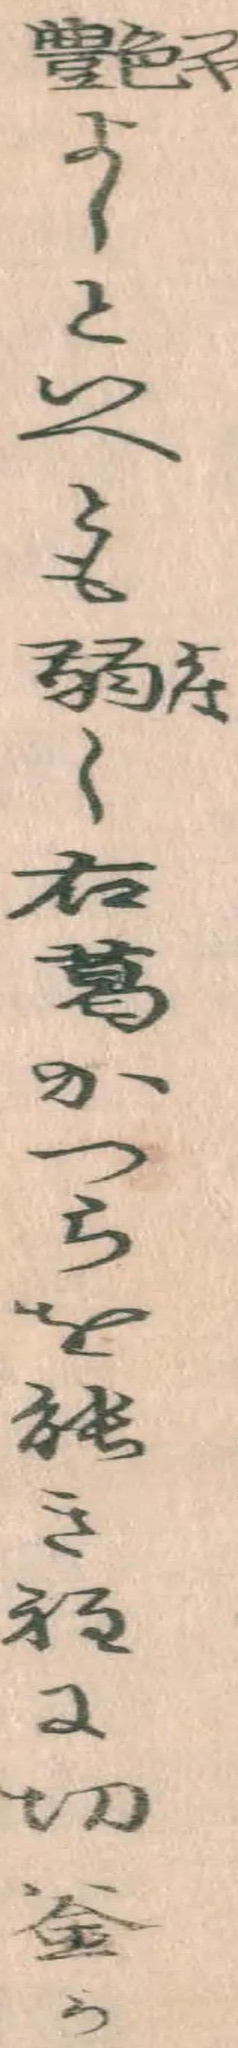艶よしといへとも弱し右葛かつらを能き程に切釜か
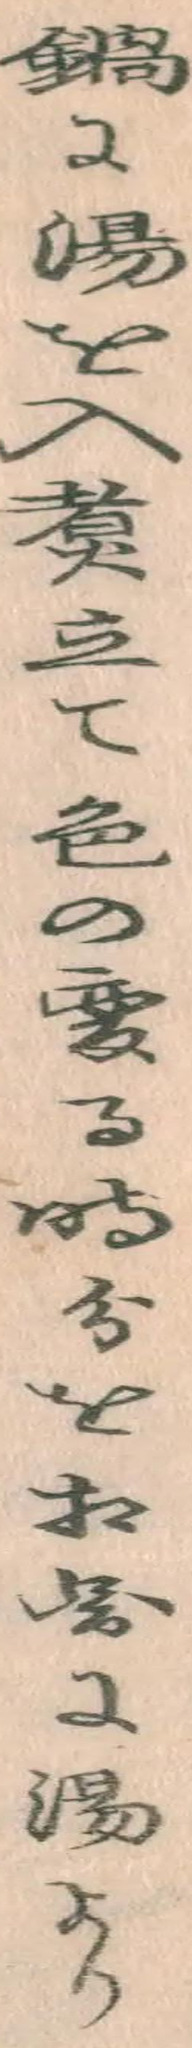鍋に湯を入煮立て色の変る時分を相図に湯より
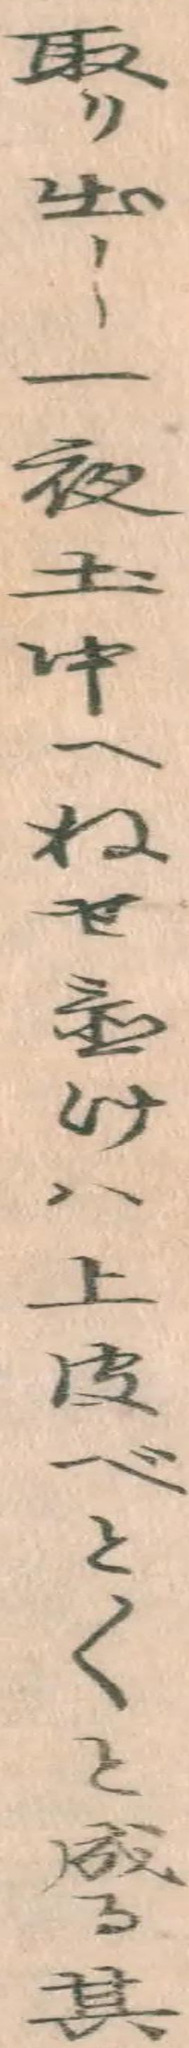取り出し一夜土中へねせ置けは上皮べと〳〵と成る其
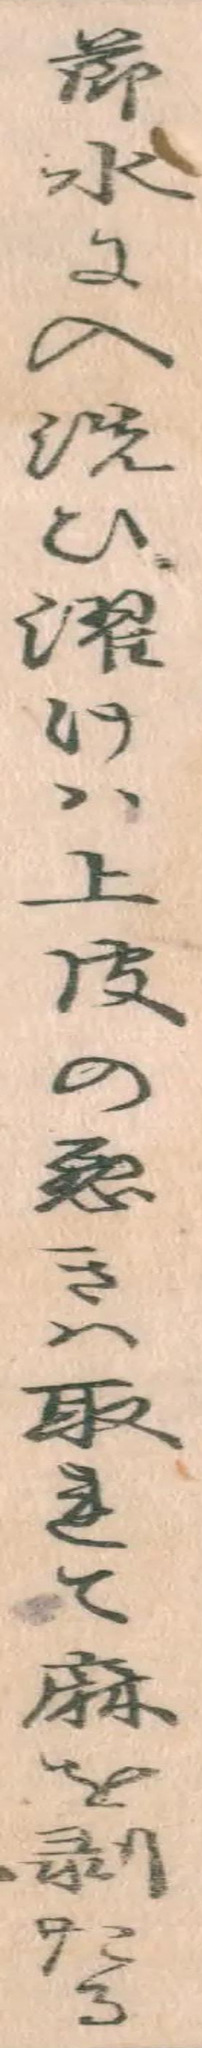節水に入洗ひ濯けは上皮の悪きは取れて麻を剥たる
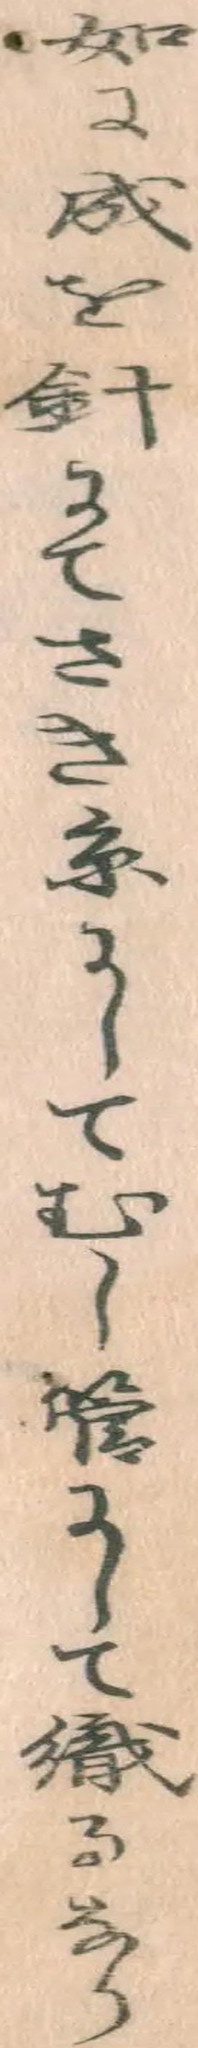如に成を針にてさき糸にしてむし管にして織るなり
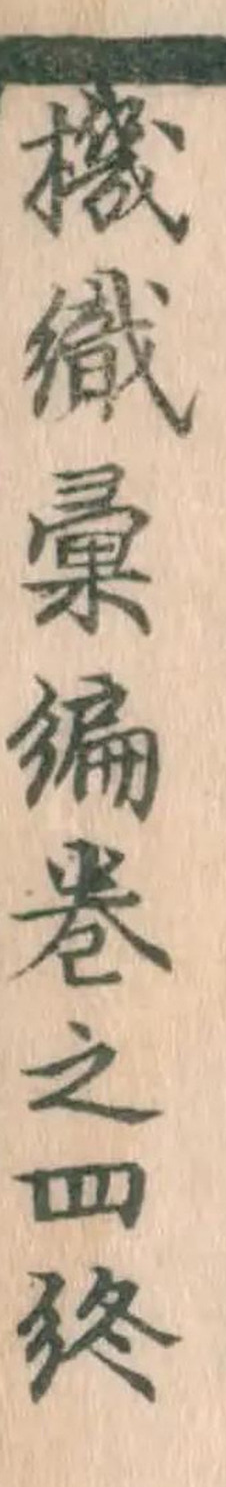機織彙編巻之四終
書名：機織彙編 5巻. [2]
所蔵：国立国会図書館 National Diet Library, JAPAN
